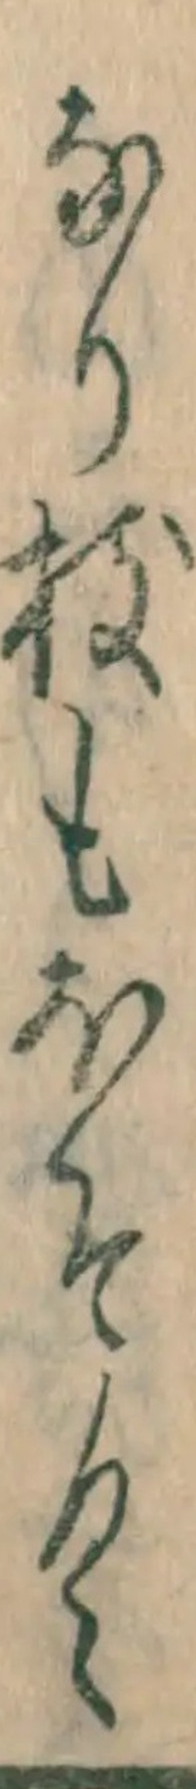なり枝もほそく
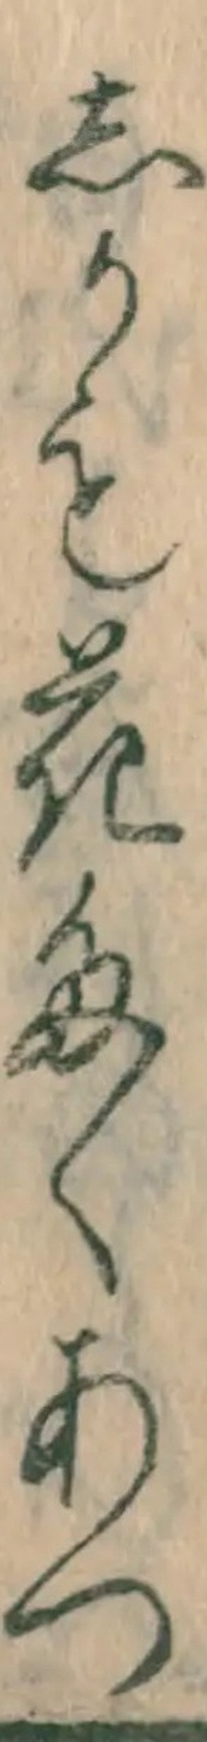しかも花多くあつ
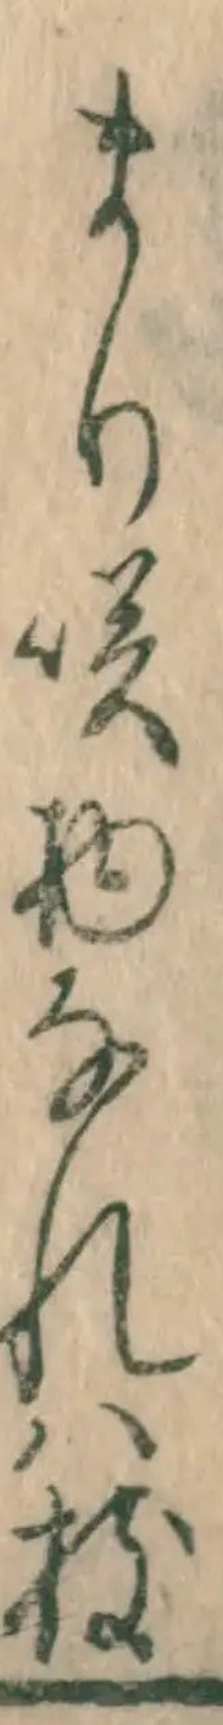まり咲物なれは枝
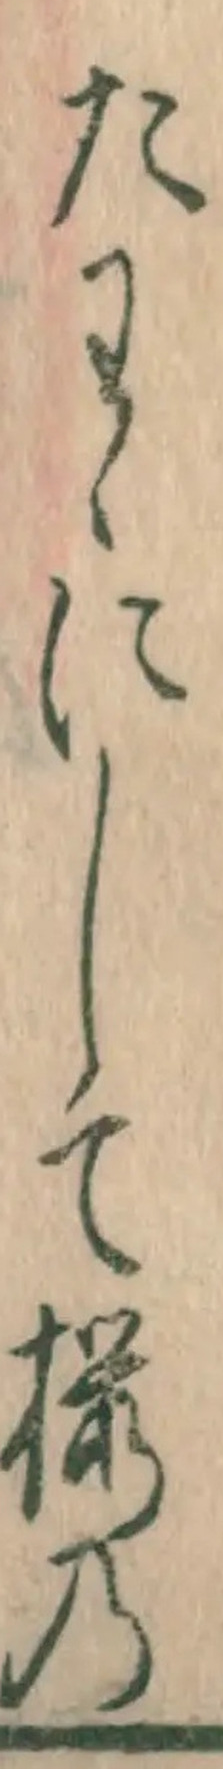たわゝにして桜の
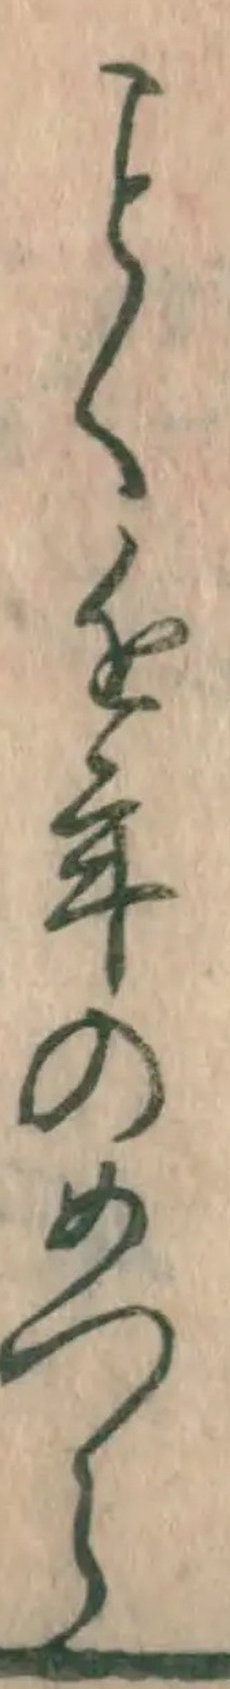ことく近年のめつら
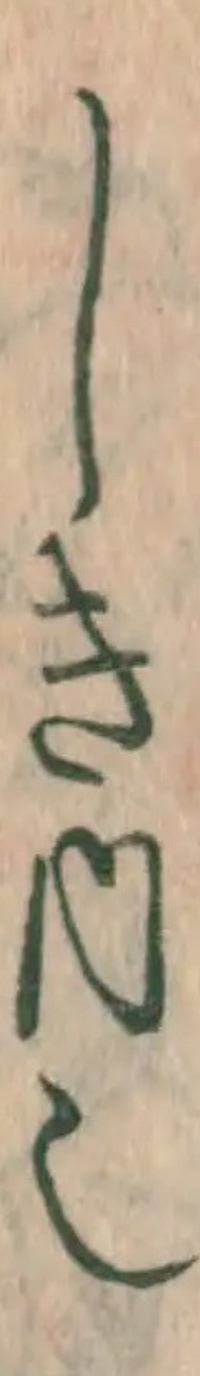しき内也
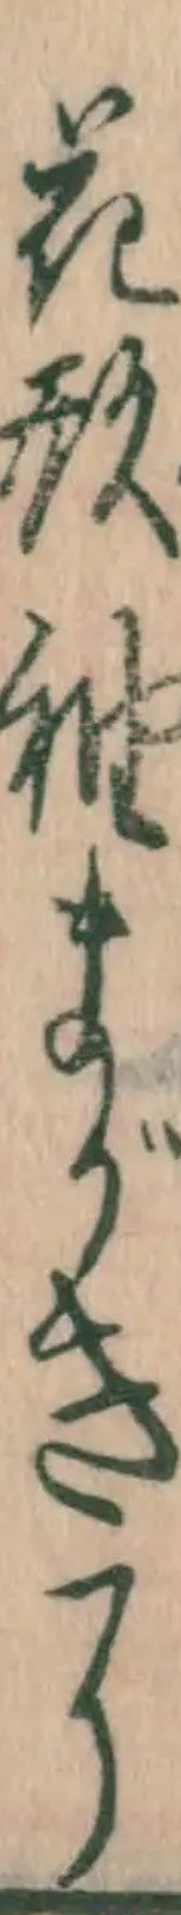花形袖まがきに
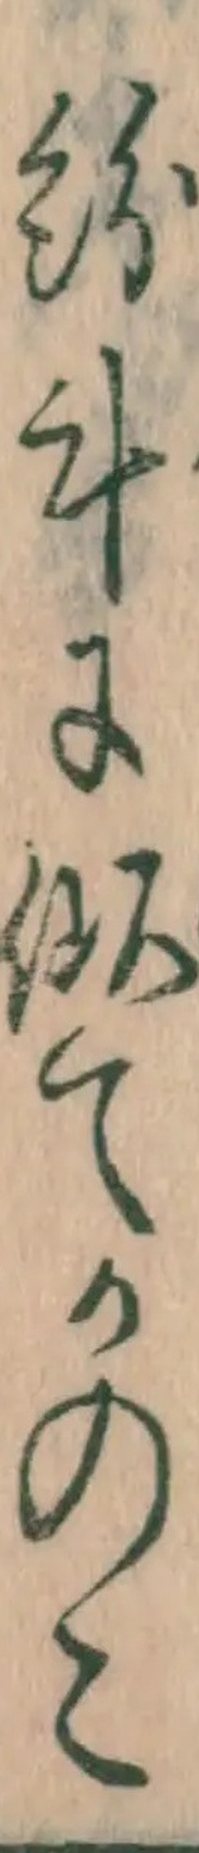紛斗に似てかのこ
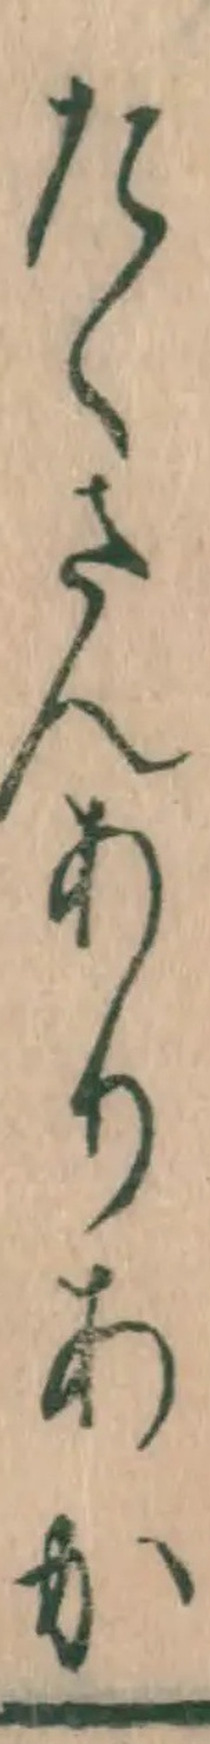たくさんありあか
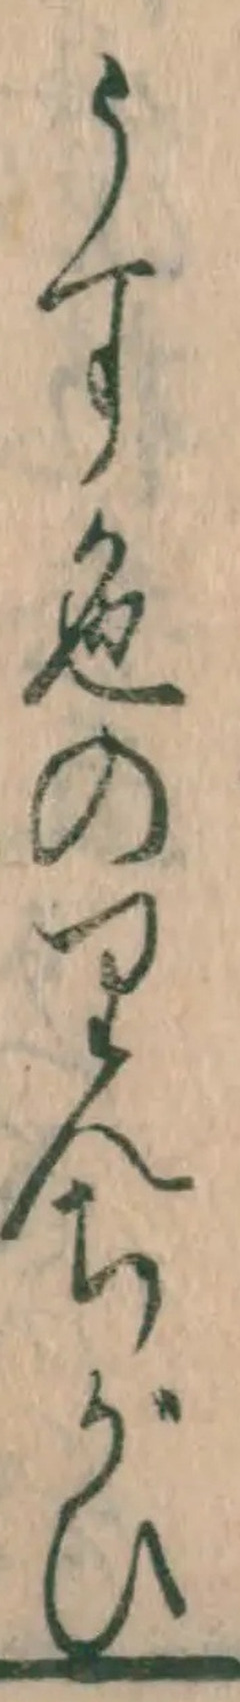うす色のりんちがひ
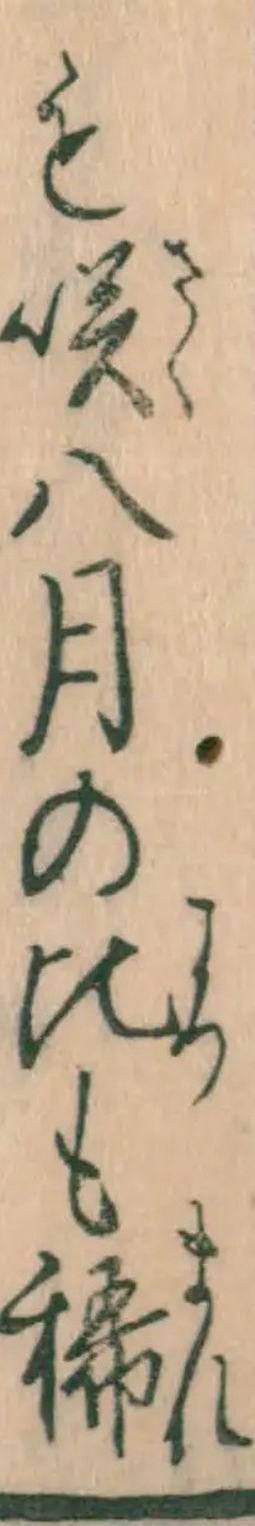も咲八月の頃も稀
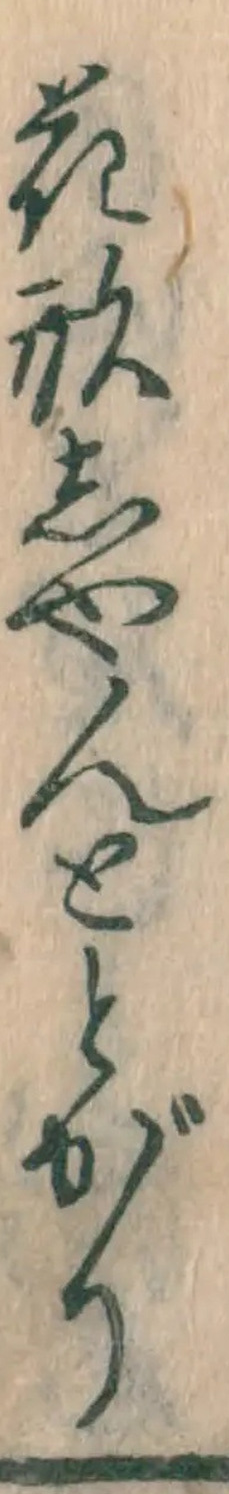花形しやんととがり

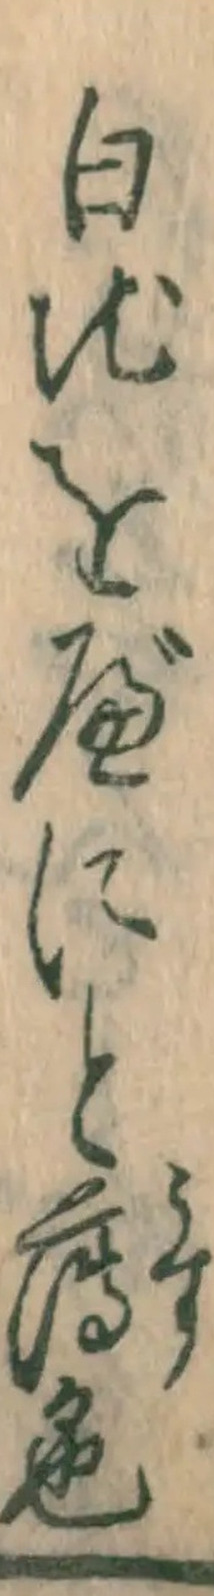白地をべにと薄色
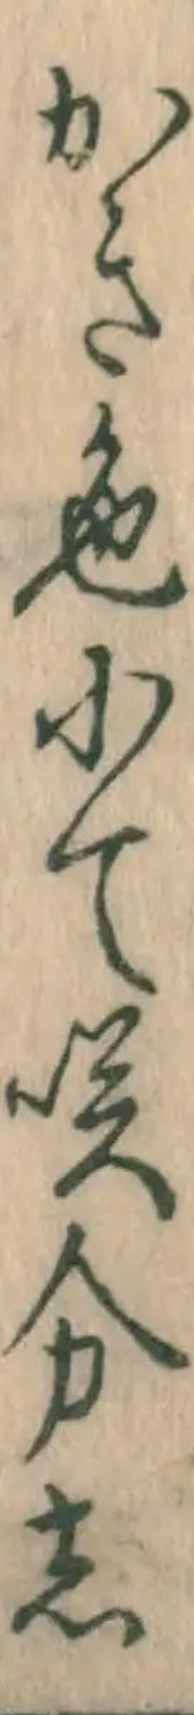かき色にて咲分し
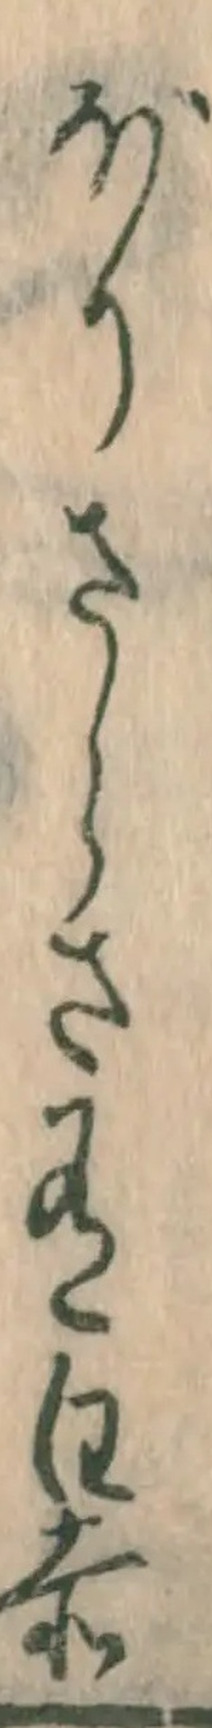ぼりさらさ有白赤
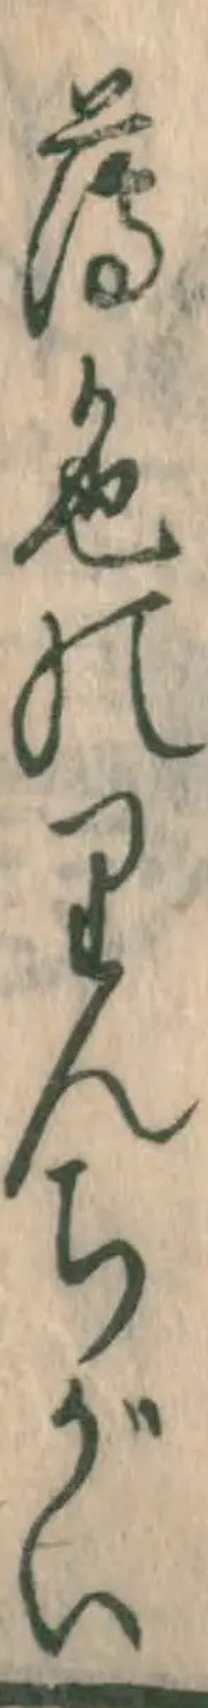薄色のりんちがい
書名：錦繍枕 5巻. [5]
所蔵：国立国会図書館 National Diet Library, JAPAN
